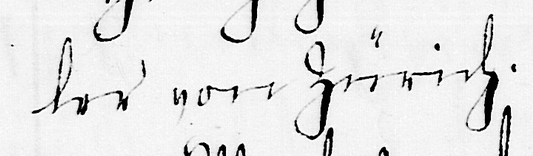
ler von Zürich.
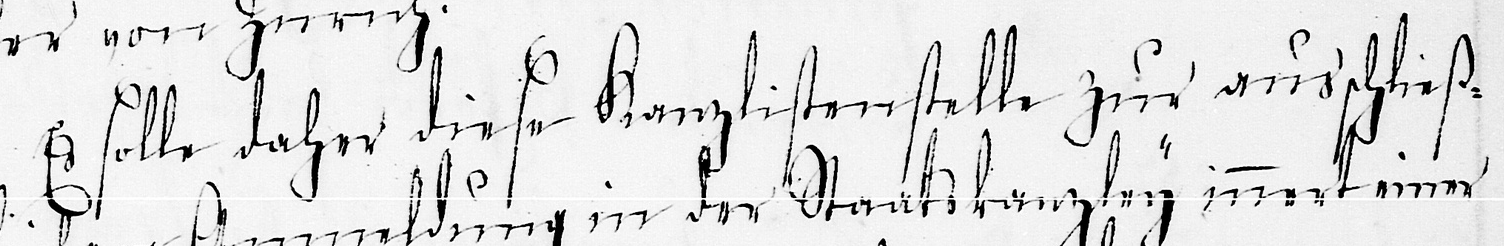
Es solle daher diese Kanzlistenstelle zur ausschließ¬
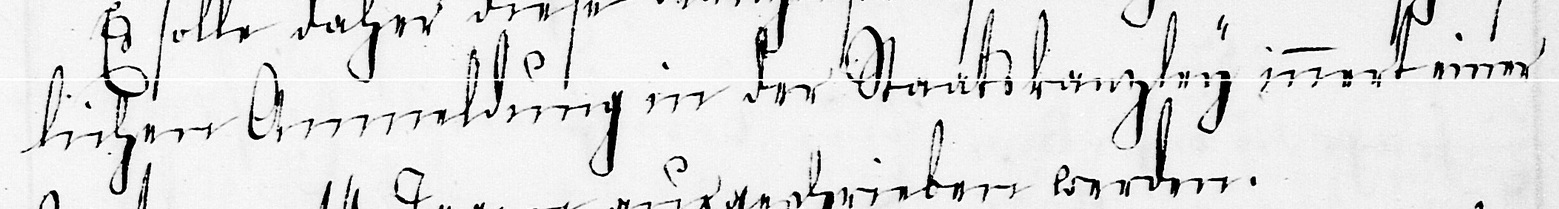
lichen Anmeldung in der Staatskanzley innert einer
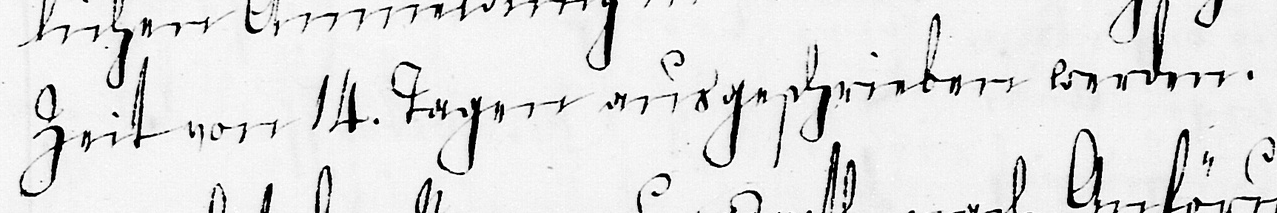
Zeit von 14. Tagen ausgeschrieben werden.
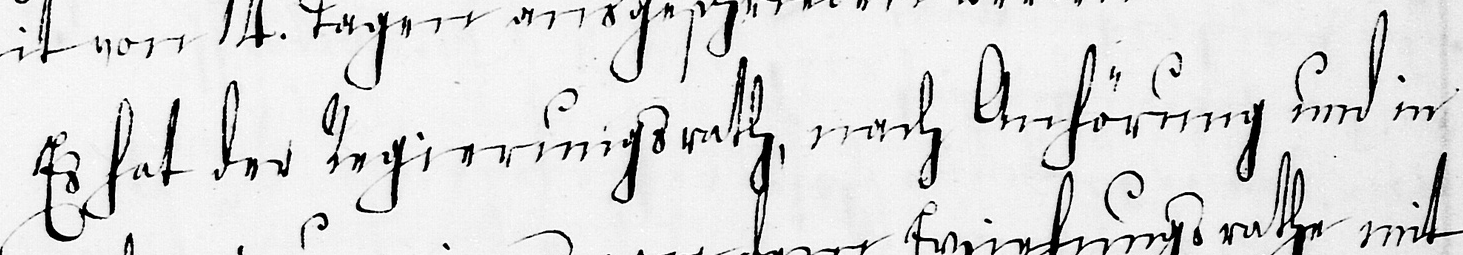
Es hat der Regierungsrath, nach Anhörung und in
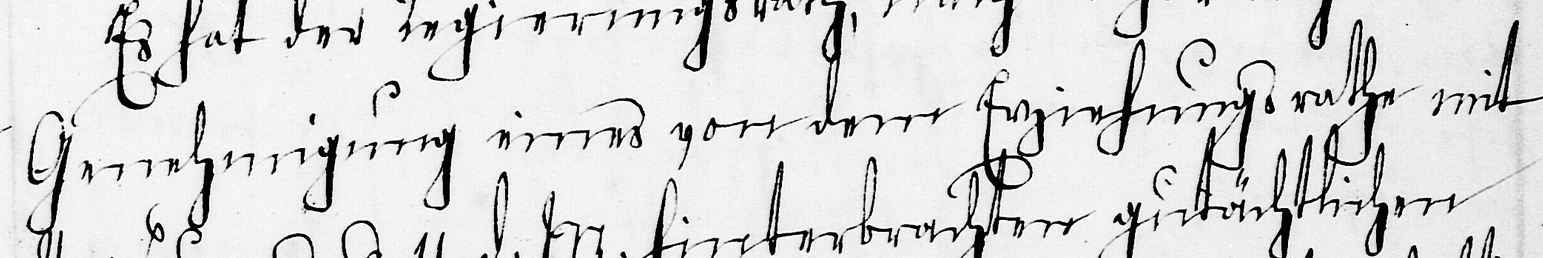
Genehmigung eines von dem Erziehungsrathe mit
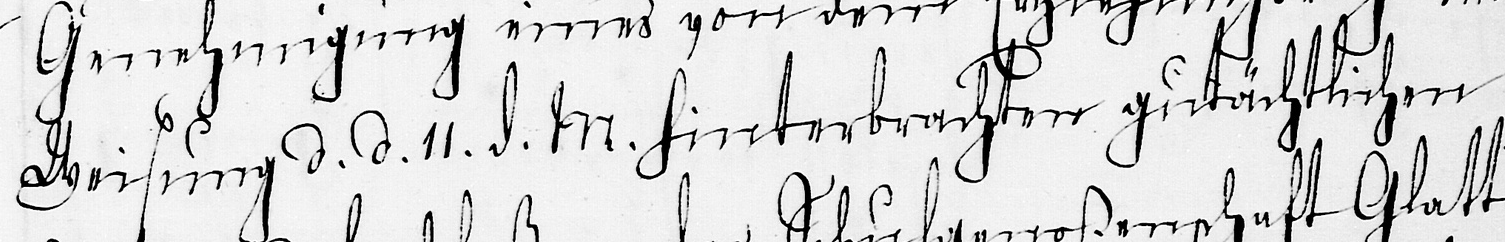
Weisung d. d. 11. d. M. hinterbrachten gutächtlichen
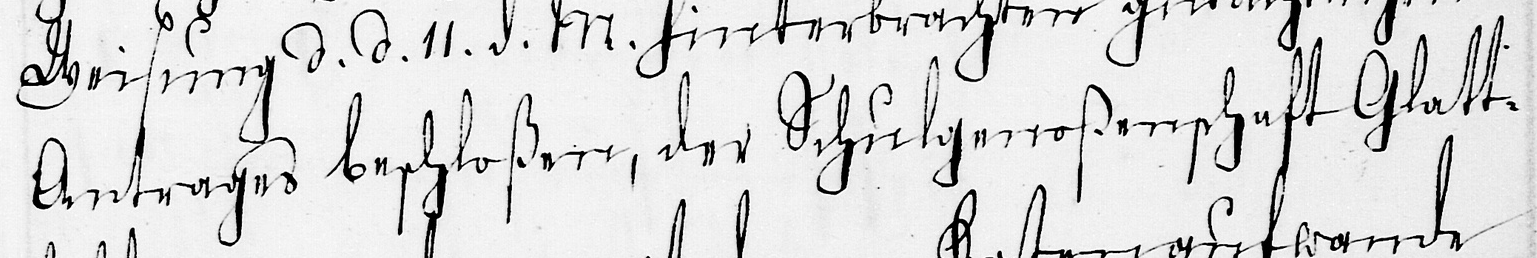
Antrages beschloßen, der Schulgenoßenschaft Glatt¬
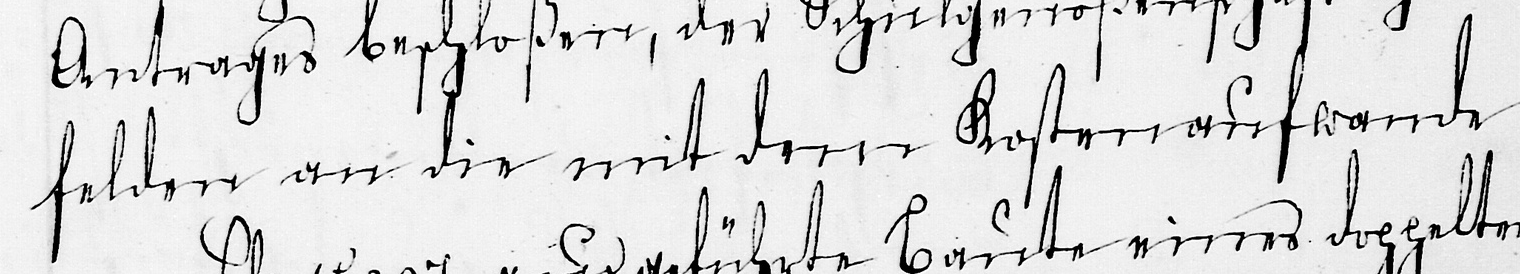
felden an die mit dem Kostenaufwande
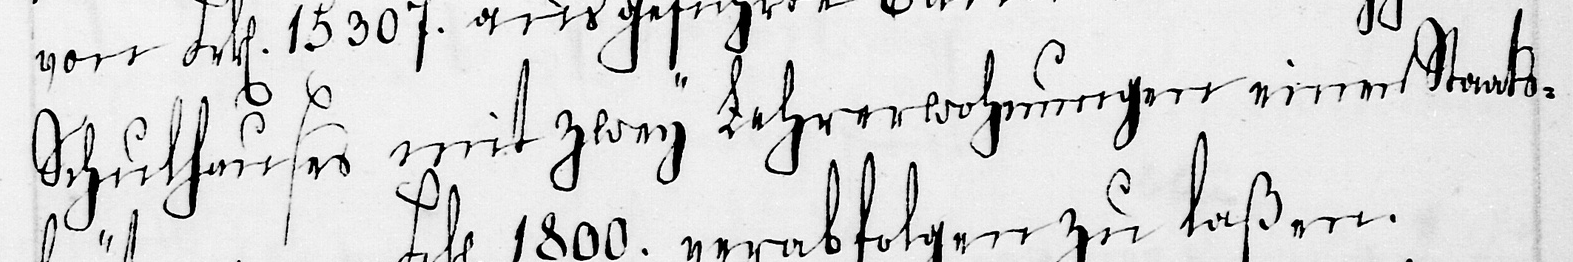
Schulhauses mit zwey Lehrerwohnungen einen Staats¬
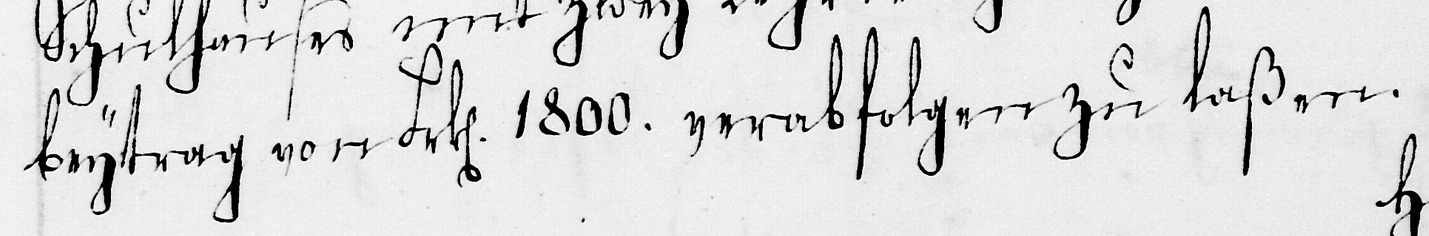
beytrag von Frk[en]. 1800. verabfolgen zu laßen.
